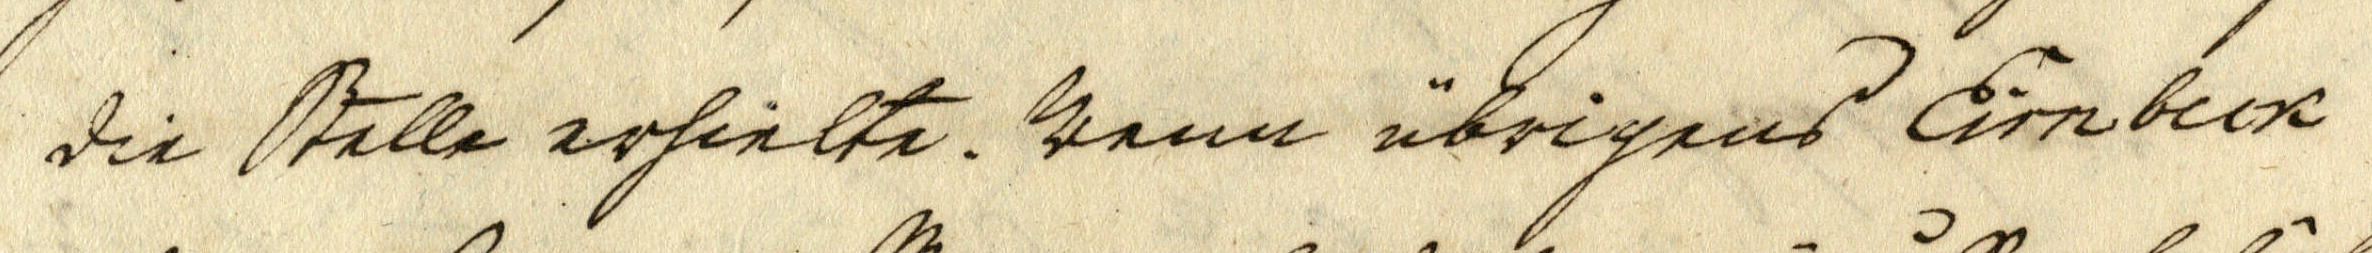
die Stelle erhielte. Wenn übrigens Eimbeck
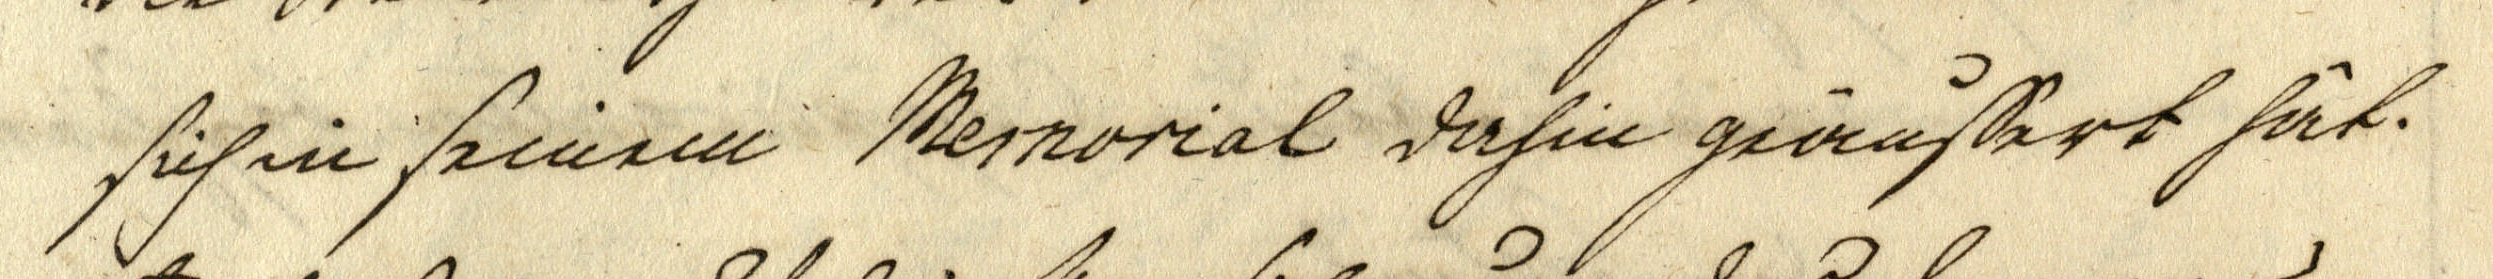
sich in seinem Memorial dahin geäussert hät-
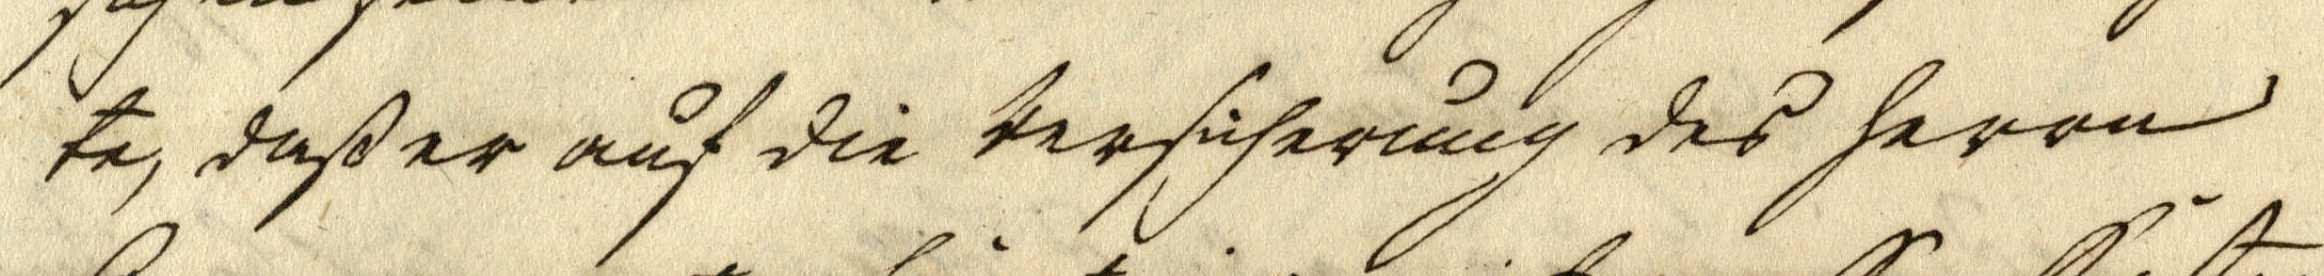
te, daß er auf die Versicherung des Herrn
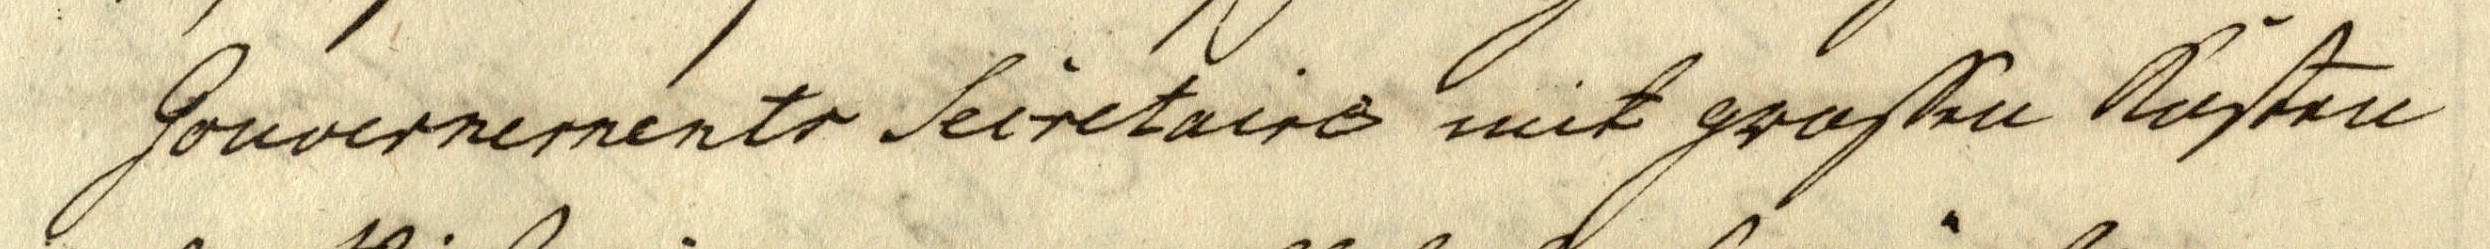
Gouvernements Secetaire mit grossen Kosten
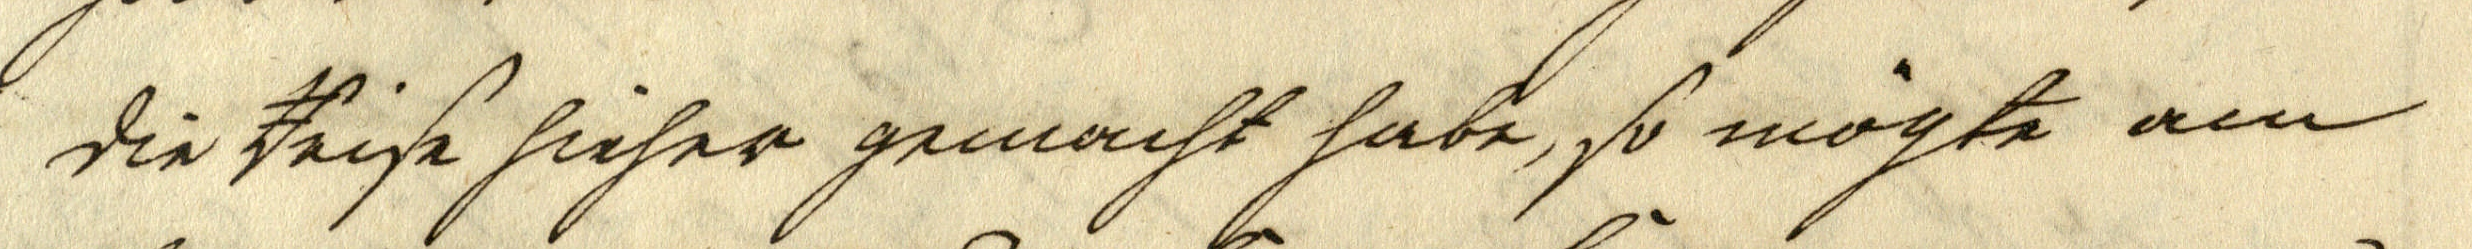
die Reise hieher gemacht habe, so mögte am
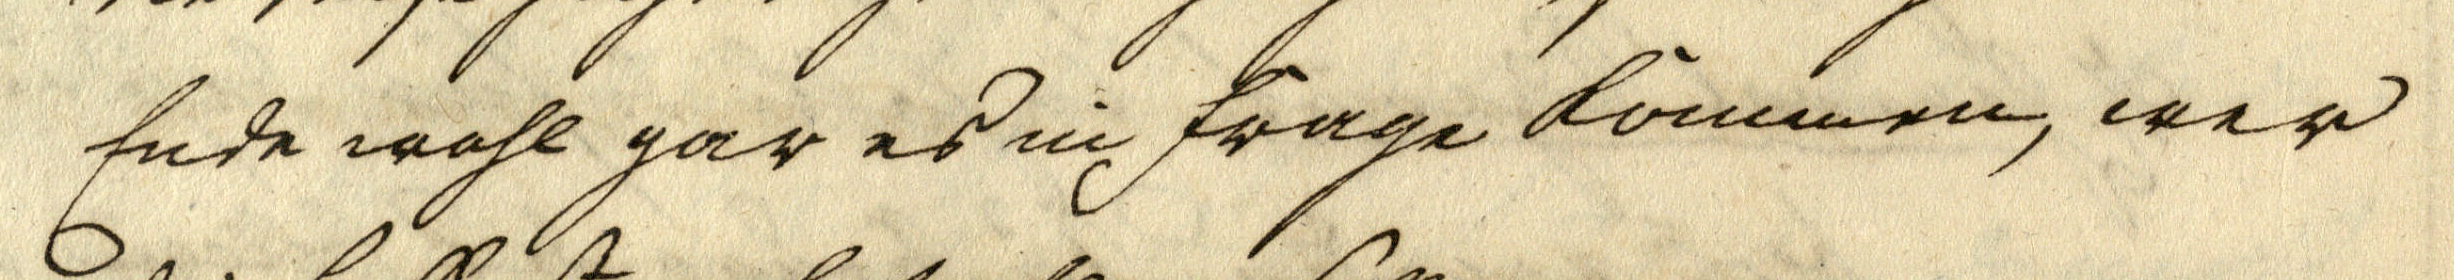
Ende wohl gar es in Frage kommen, wer
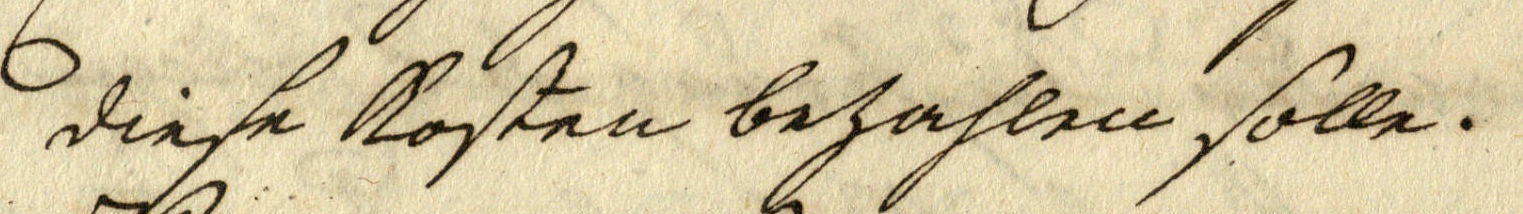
diese Kosten bezahlen solle.
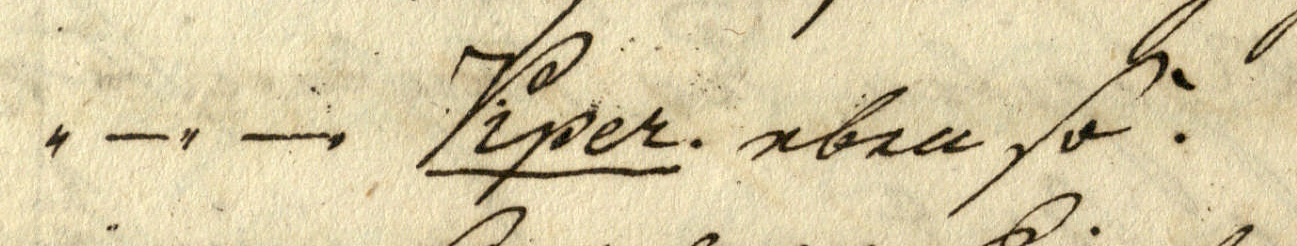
" - " - " Piper. eben so.
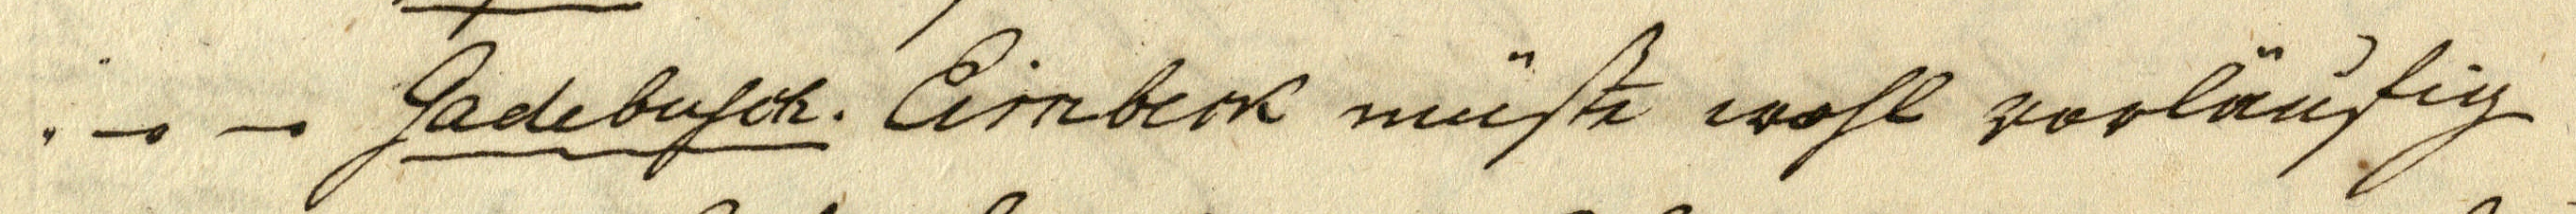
" - " - " Gadebusch: Eimbeck müßte wohl vorläufig
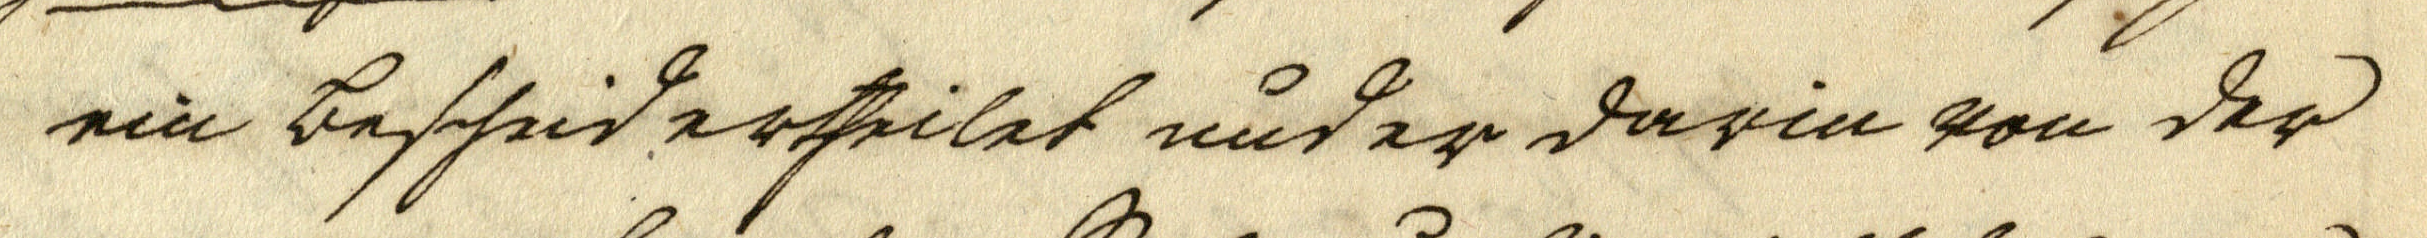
ein Bescheid ertheilet und er darin von der
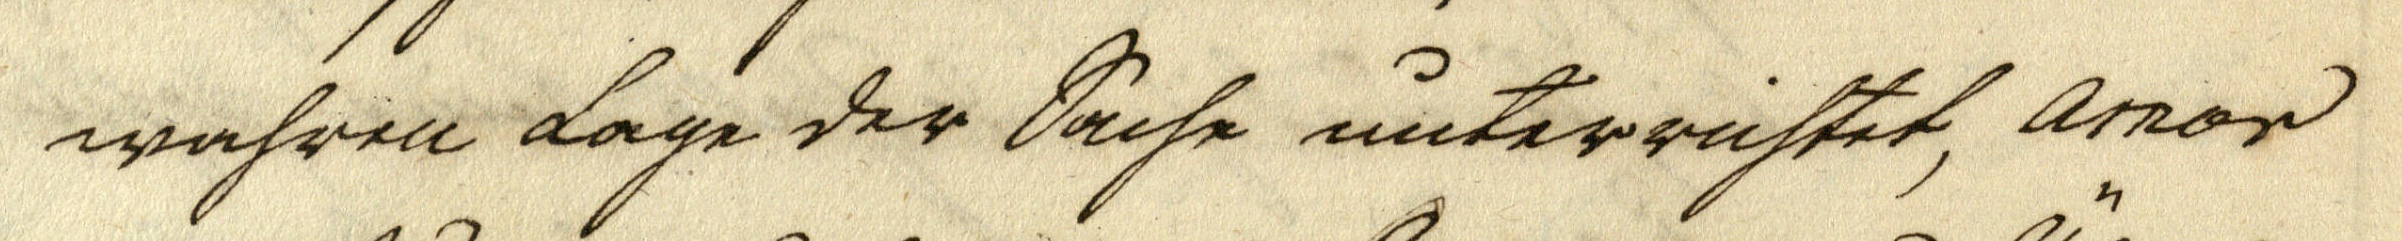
wahren Lage der Sache unterrichtet, Amor
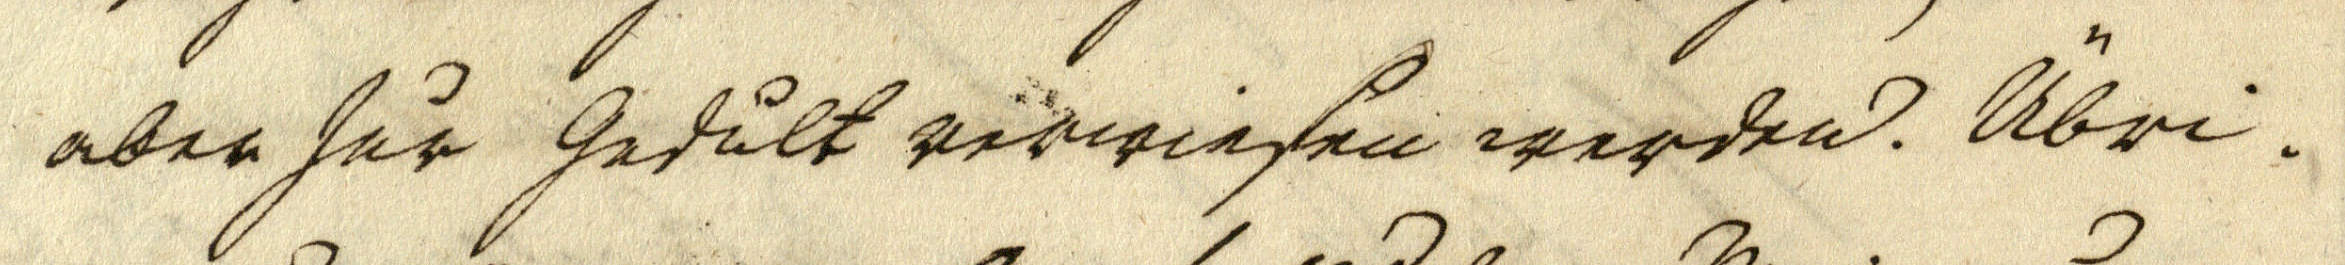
aber zur Gedult verwiesen werden. Übri-
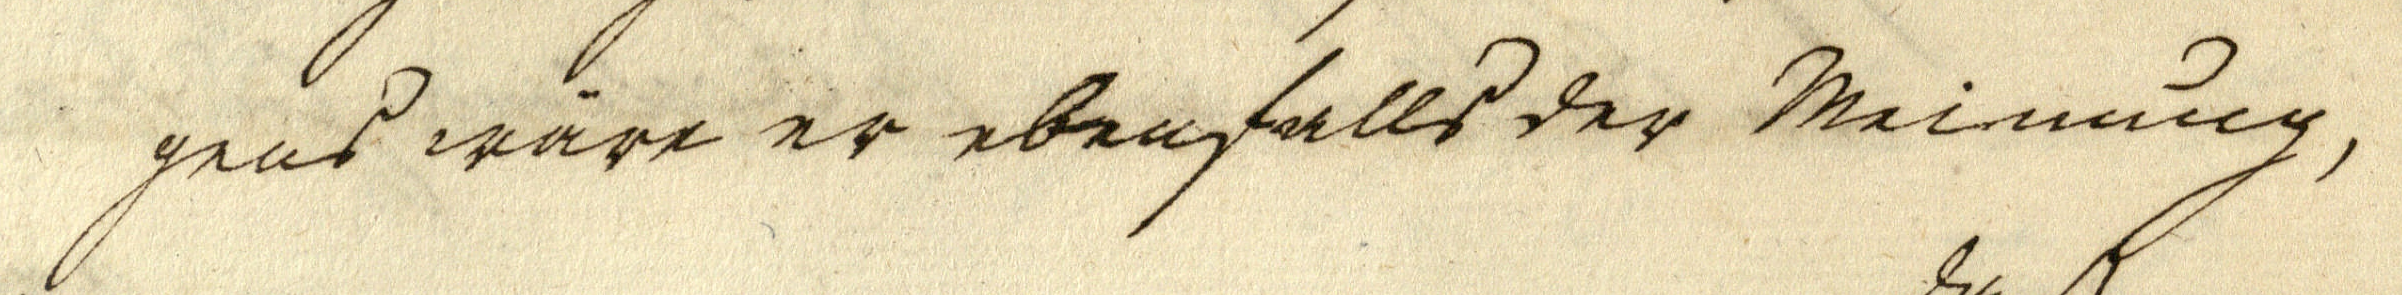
gens wäre er ebenfalls der Meinung,
